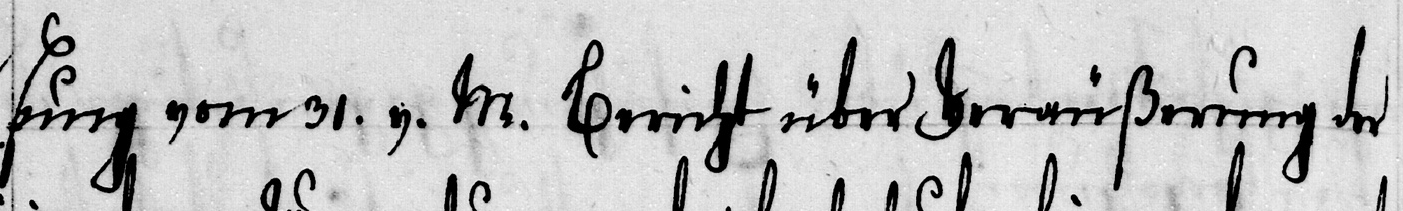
sung vom 31. v. M. Bericht über Veräußerung der
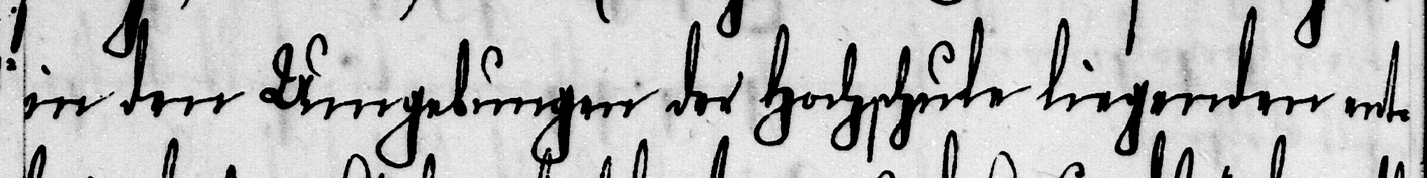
in den Umgebungen der Hochschule liegenden ent¬
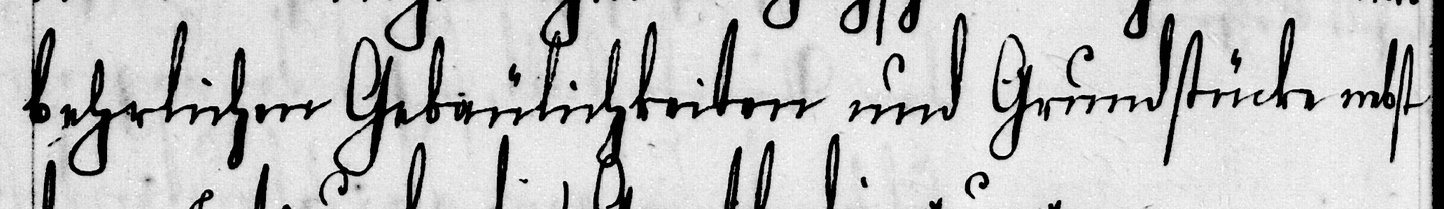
behrlichen Gebäulichkeiten und Grundstücke n¬
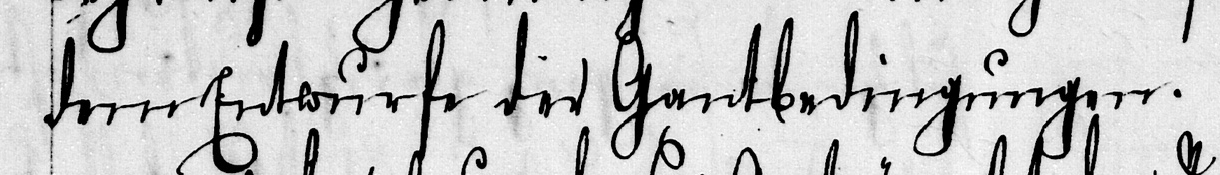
dem Entwurfe der Gantbedingungen.
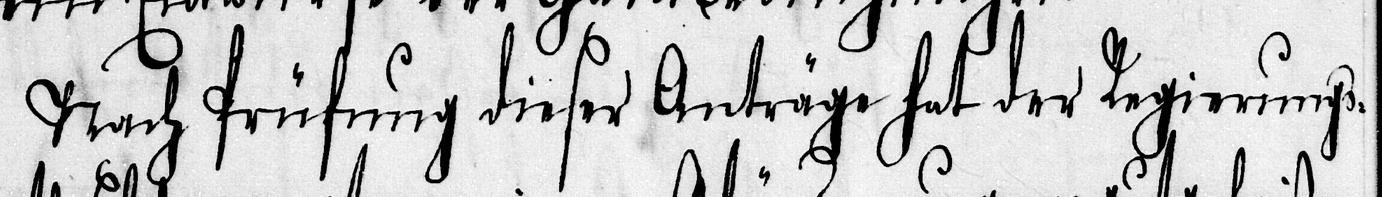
Nach Prüfung dieser Anträge hat der Regierung¬
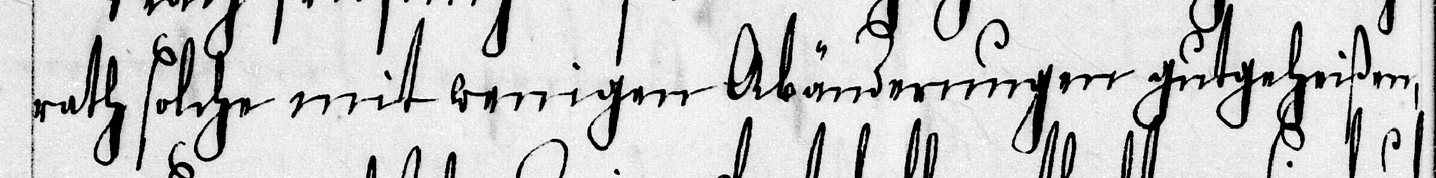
srath solche mit wenigen Abänderungen gutgeheißen,
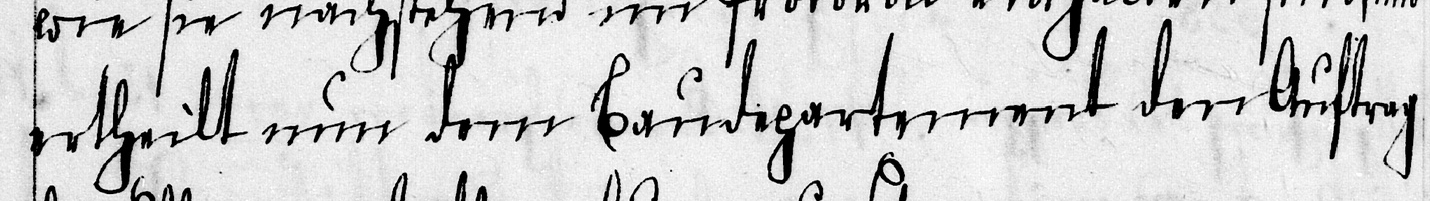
ertheilt nun dem Baudepartement den Auftrag
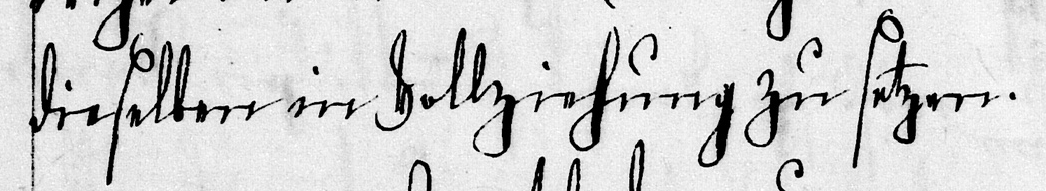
dieselben in Vollziehung zu setzen.
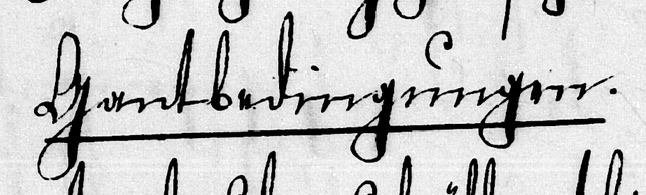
Gantbedingungen.
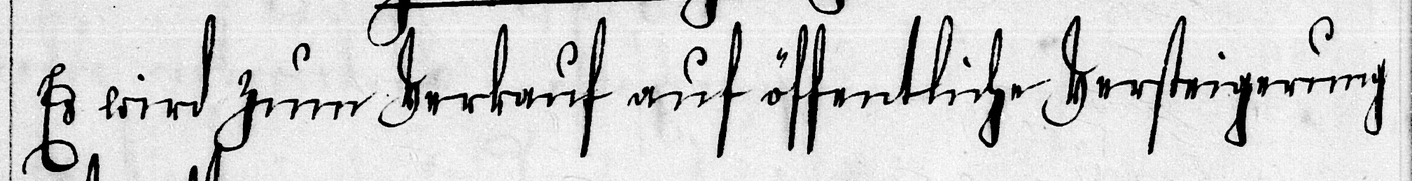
Es wird zum Verkauf auf öffentliche Versteigerung
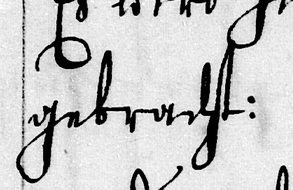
gebracht:
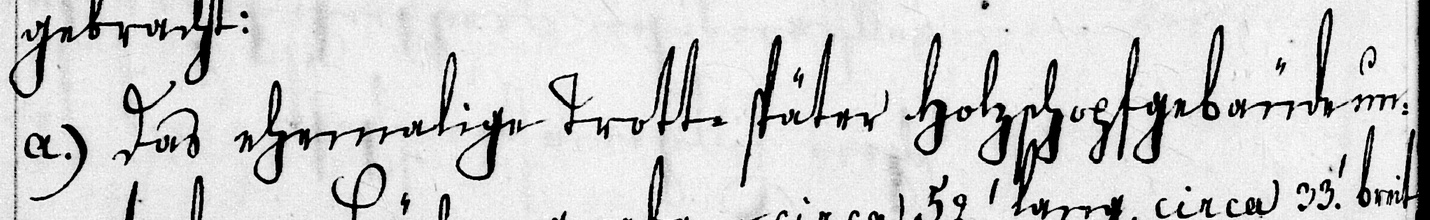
a.) Das ehemalige Trott- später Holzschopfgebäude un¬
